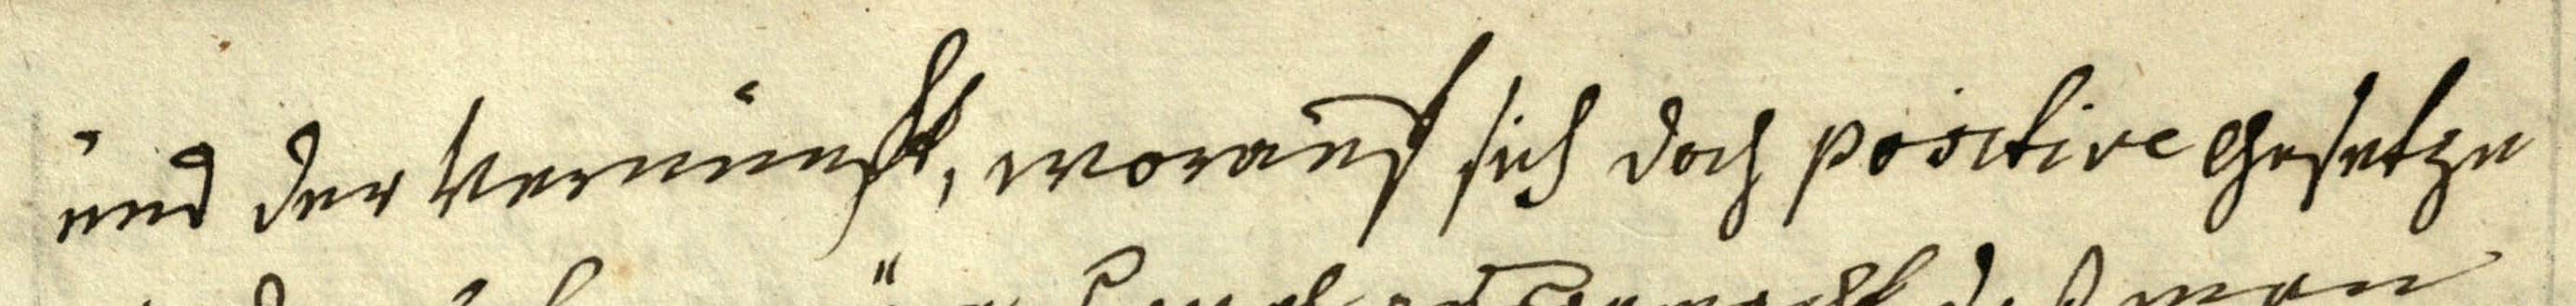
und der Vernunft, worauf sich doch positive Gesetze
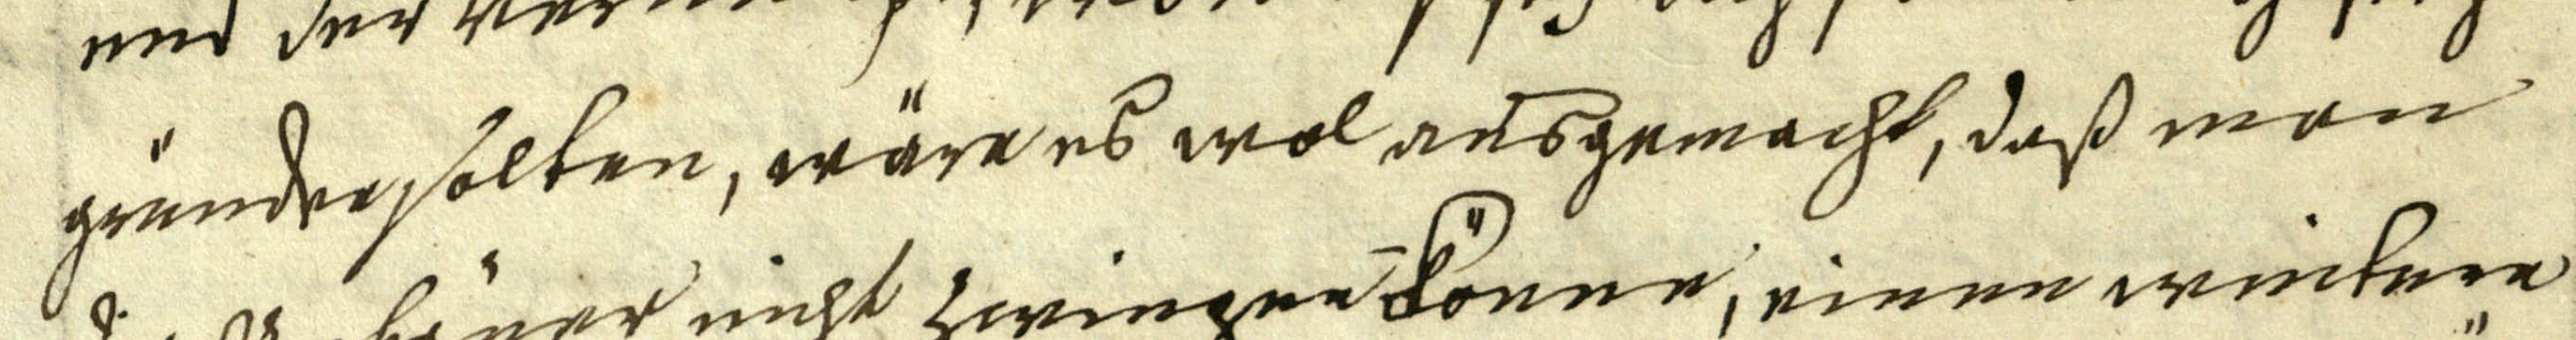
gründen solten, wäre es wol ausgemacht, daß man
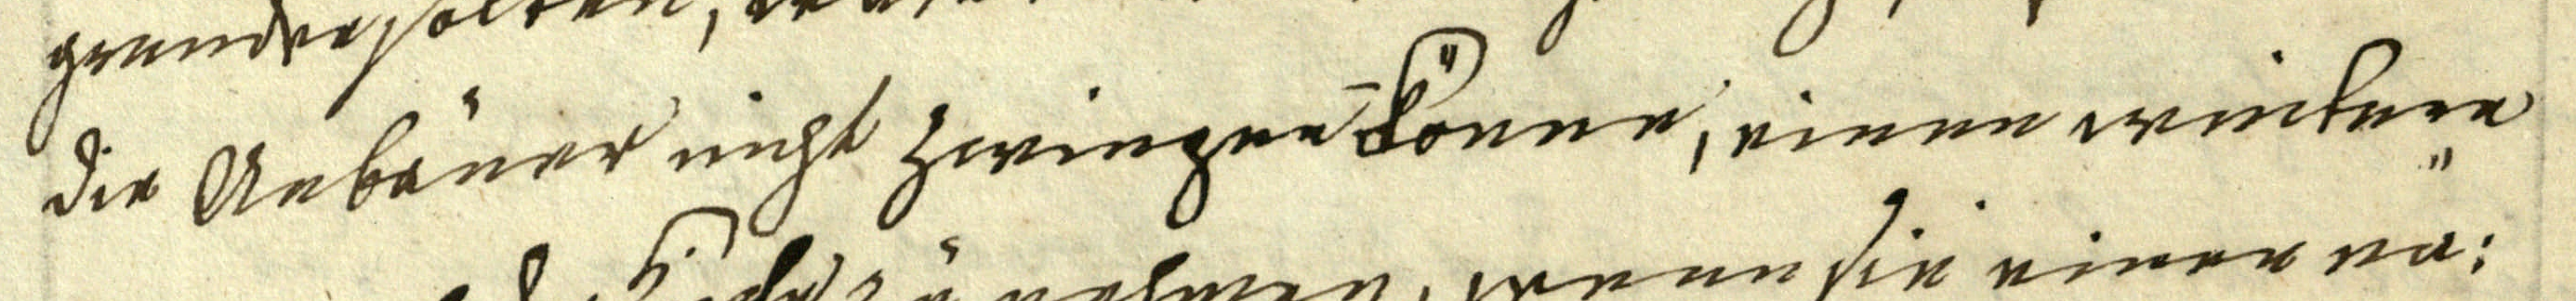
die Anbauer nicht zwingen könne, einen weitern
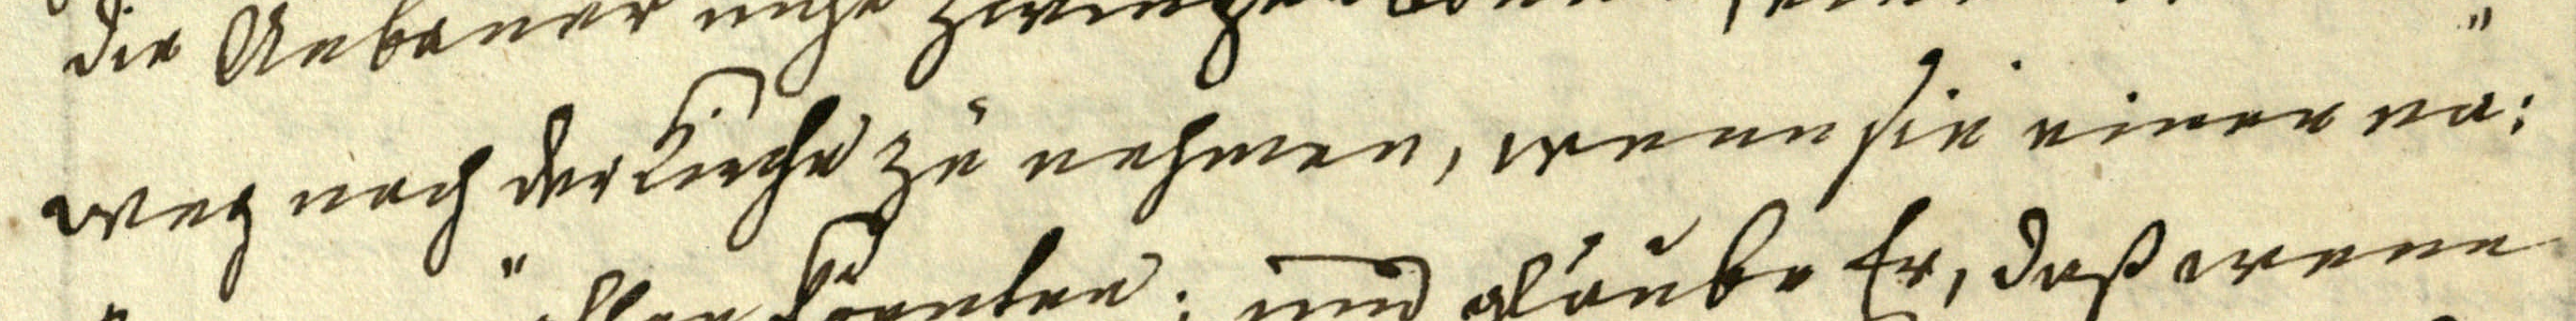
Weg nach der Kirche zu nehmen, wenn sie einen nä¬
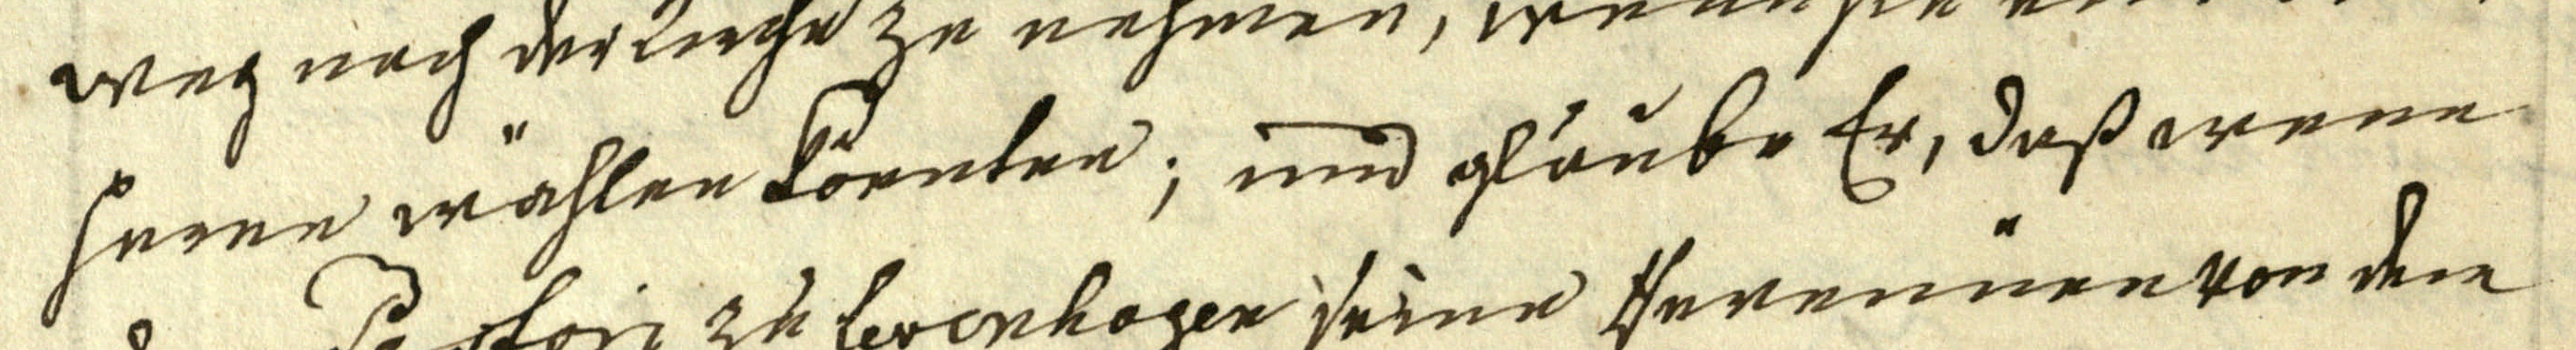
heren wählen könnten, und glaube Er, daß wenn
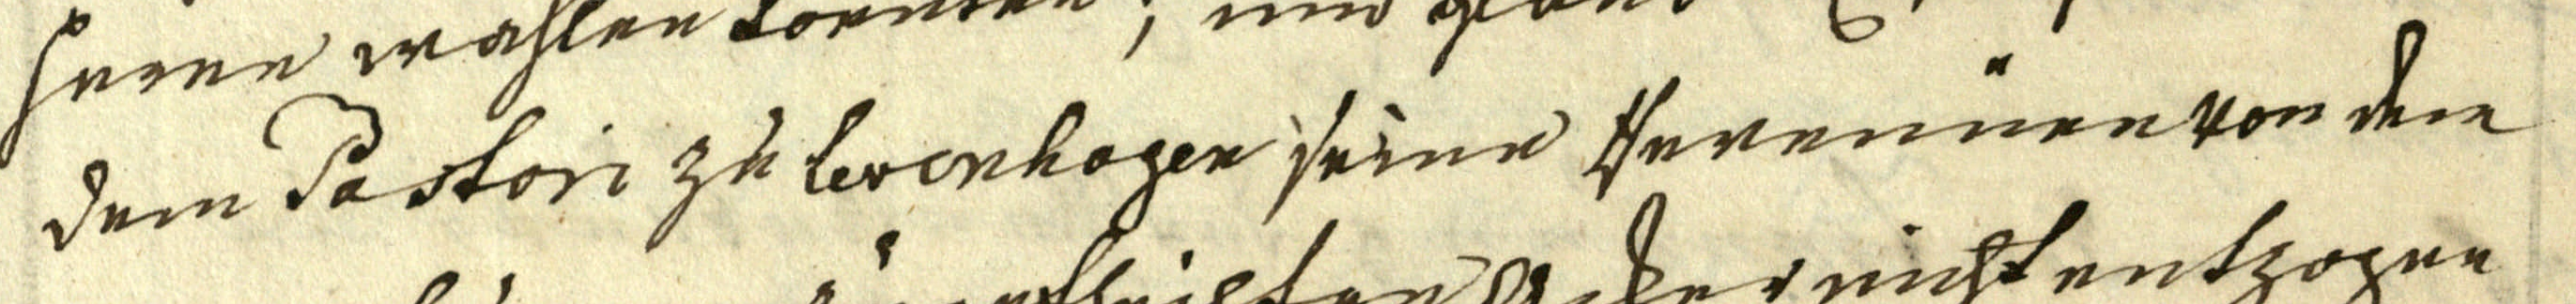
dem Pastori zu Levenhagen seine Revenuen von dem
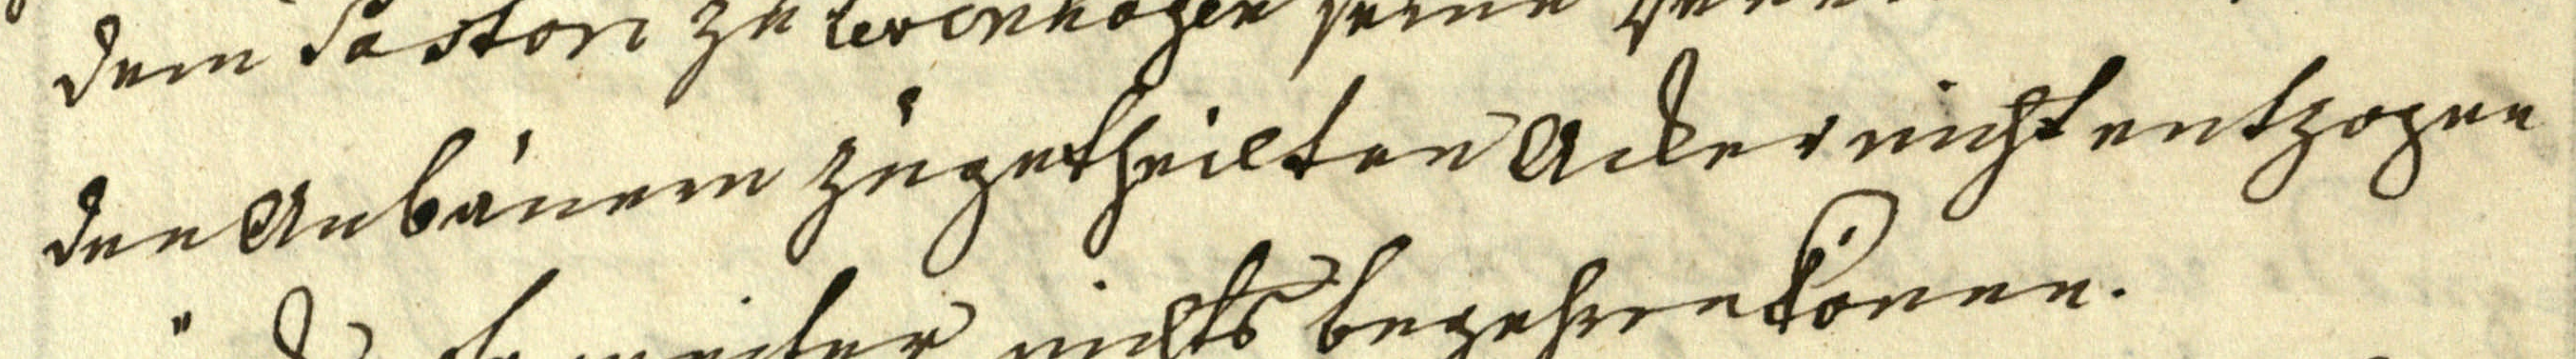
den Anbauern zugetheilten Acker nicht entzogen
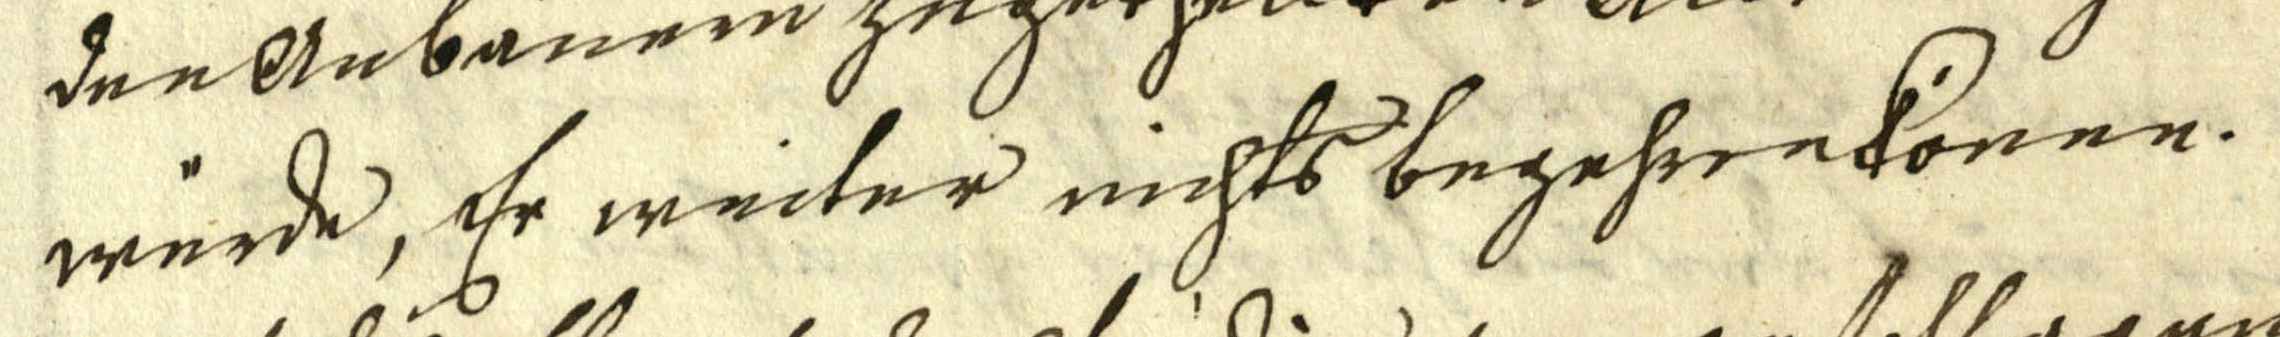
würde, Er weiter nichts begehren könne.
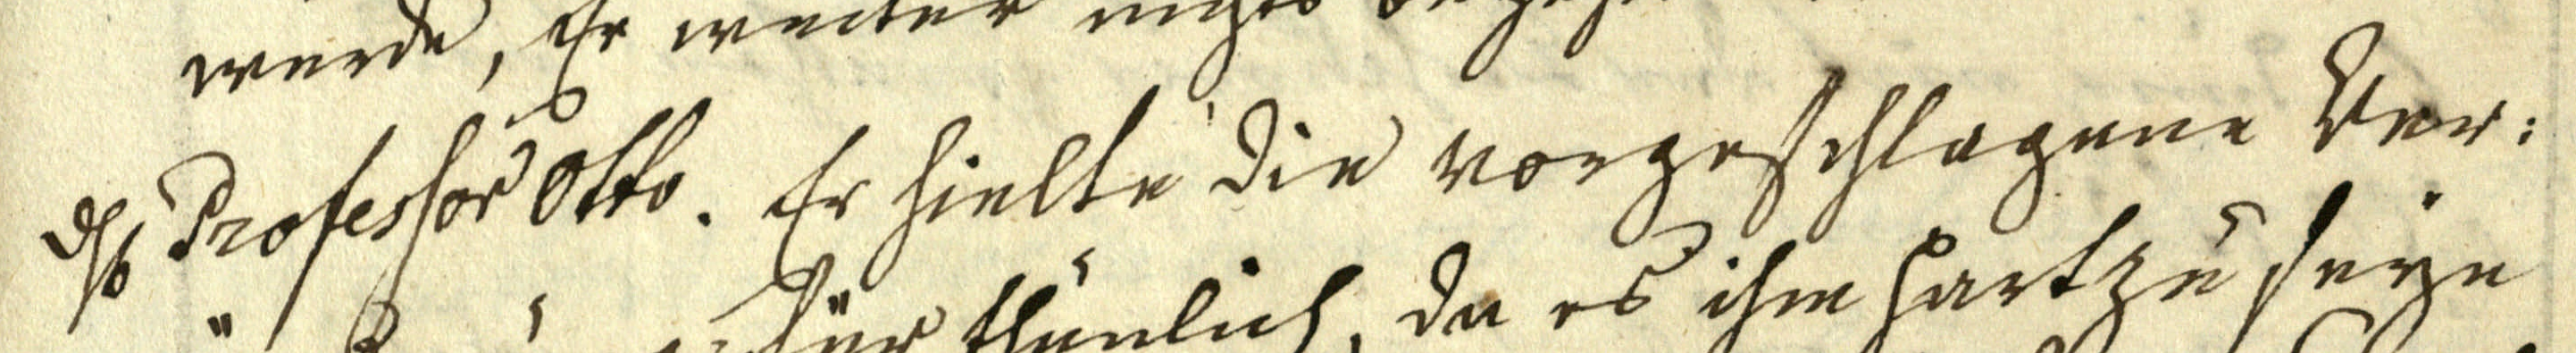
dh Professor Otto. Er hielte die vorgeschlagene Ver¬
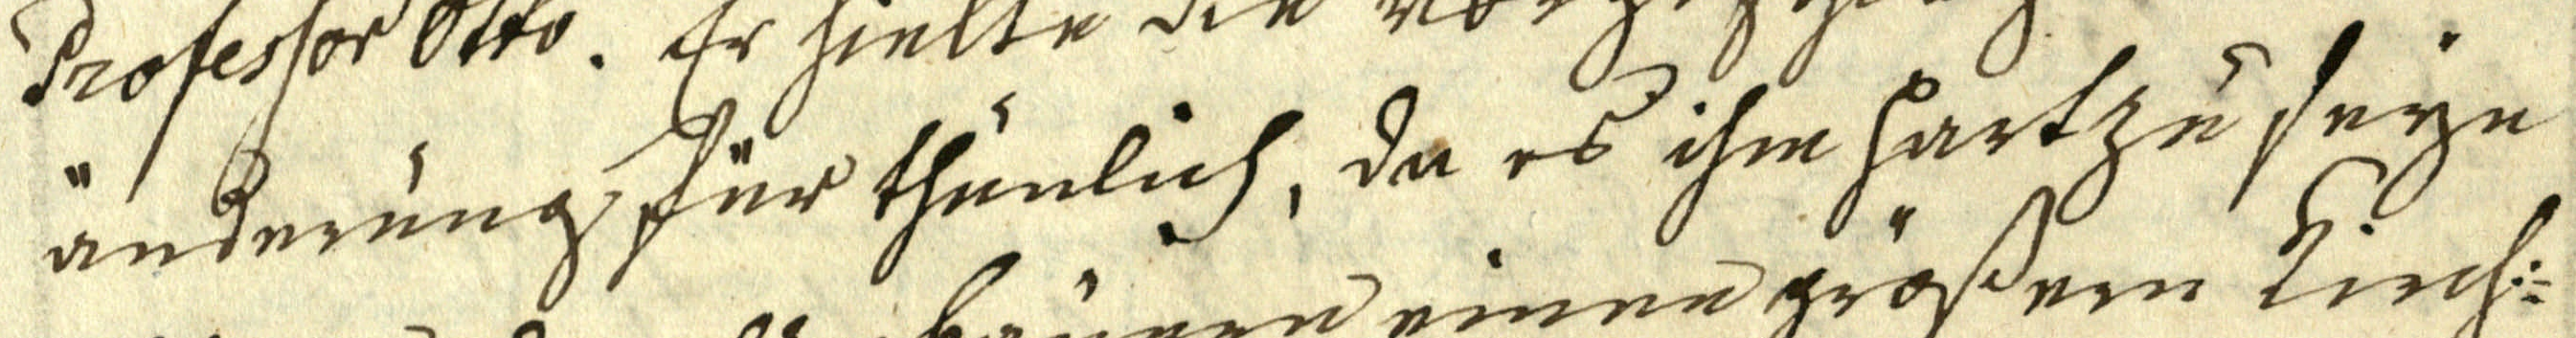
änderung für thunlich, da es ihm hart zu seÿn
